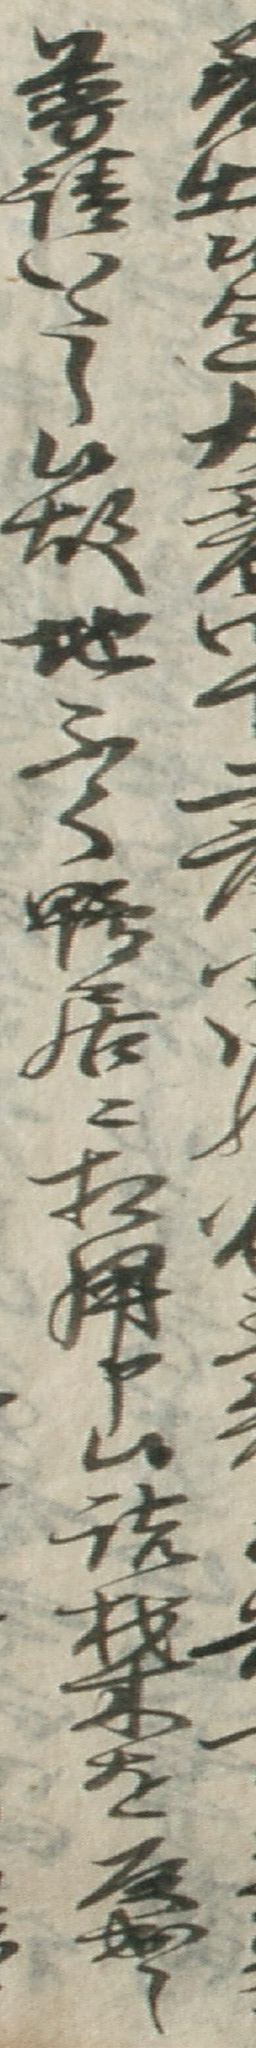普請いたし候故地ふく鴨居二相用申候諸材木を取出し
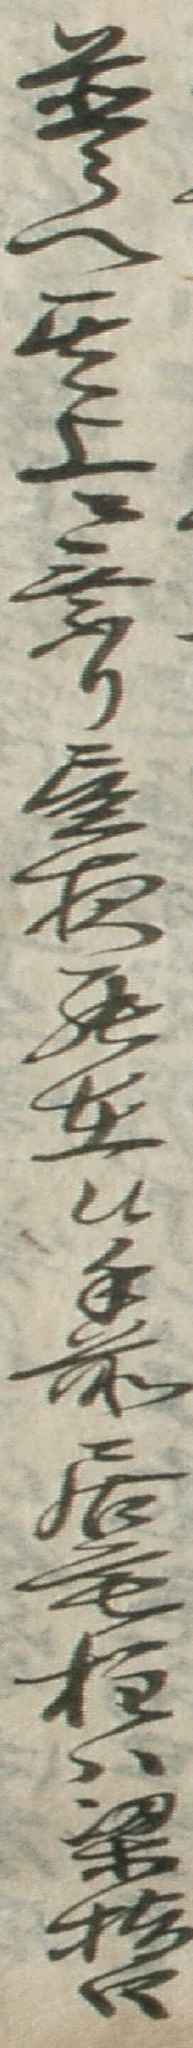並らへ其上二乗り屋根罷在候手前居宅柱ハ梁拾四
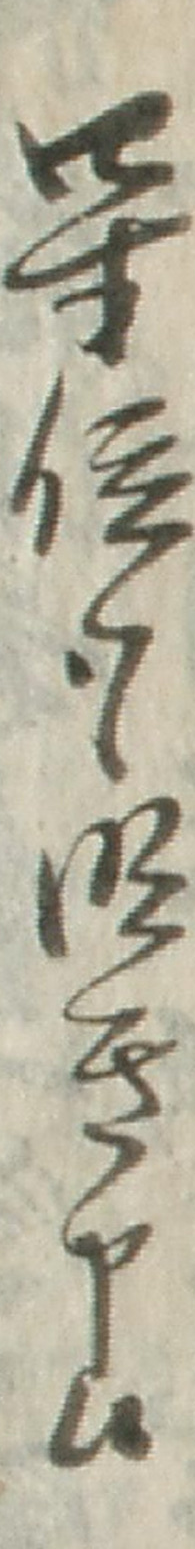四寸位ッゝ明き申候

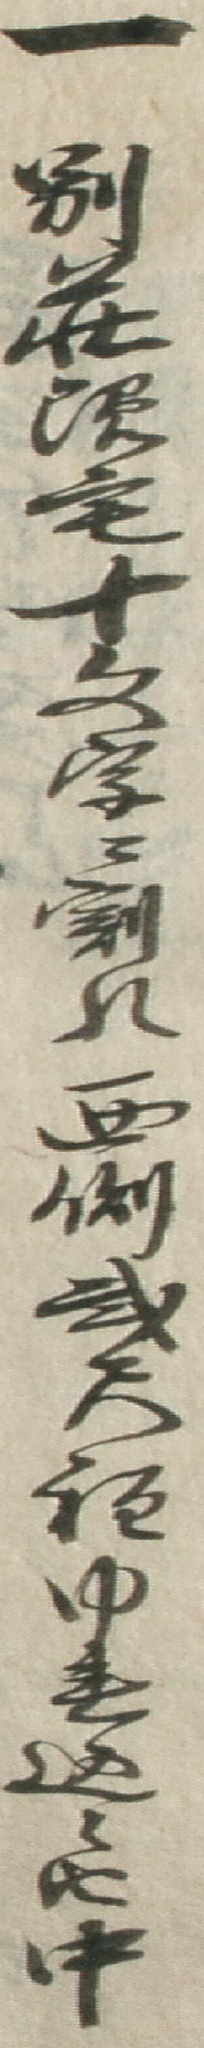一別荘隠宅十文字二割れ西側弐尺程ゆれ込候由中
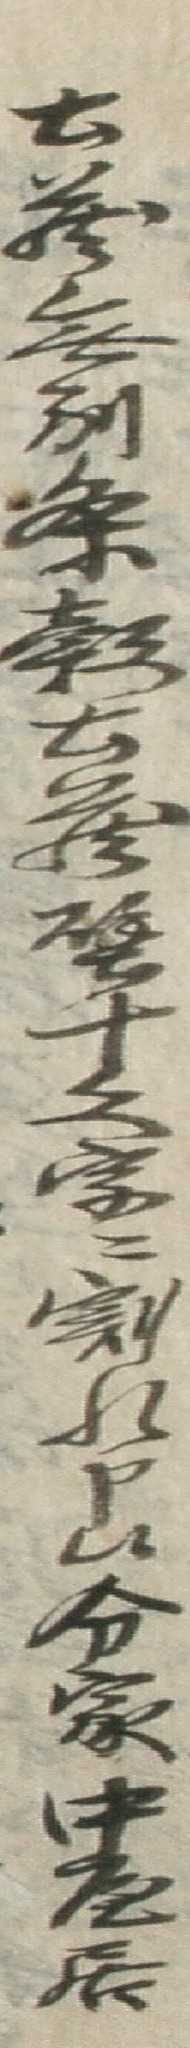土蔵無別条穀土蔵壁十文字二割れ申候分家中屋居
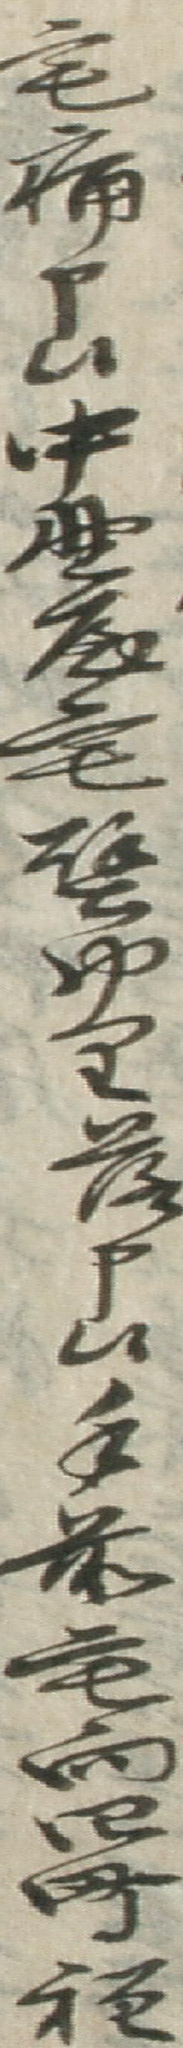宅痛申候中野殿宅壁ゆり落申候手前宅向四町程
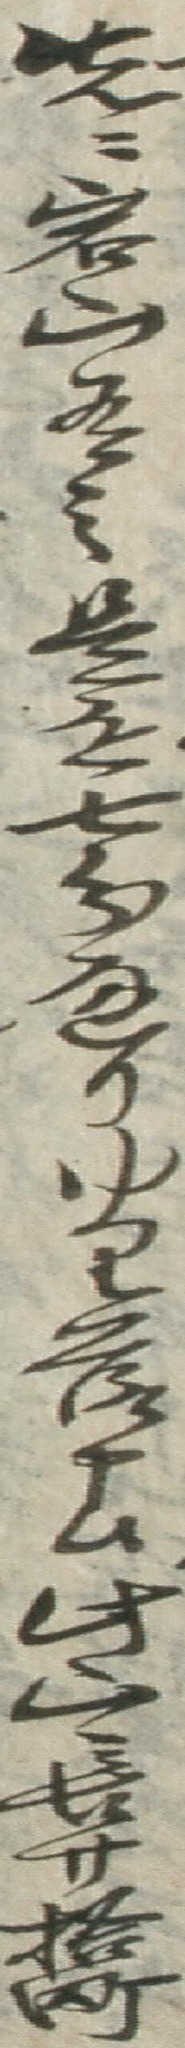先二岩山有之是を七分通りゆり落申候此山長サ拾町
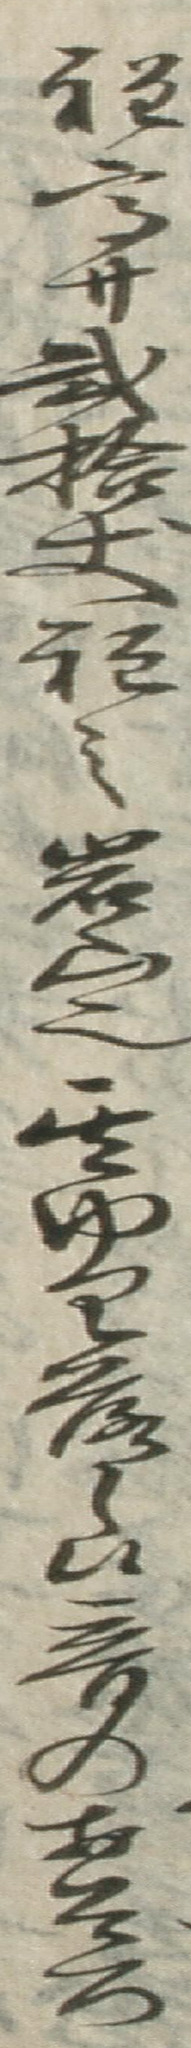程高サ弐拾丈程之岩山也其ゆり落し候音のおそろ
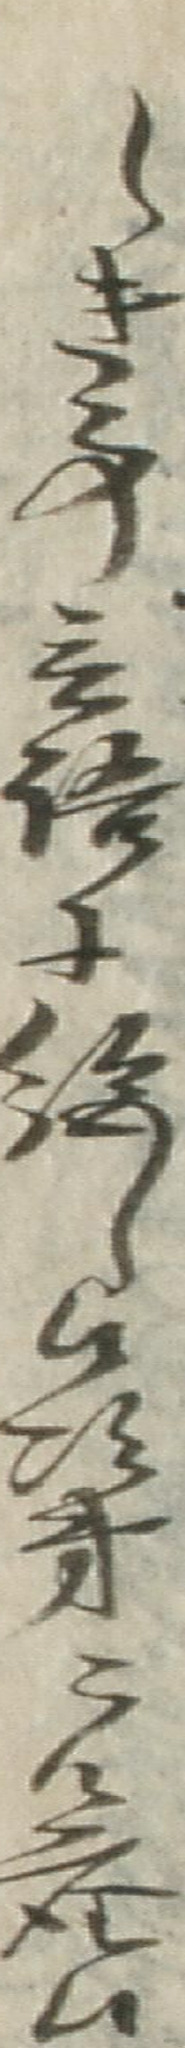しき事言語に絶し候次第二御座候
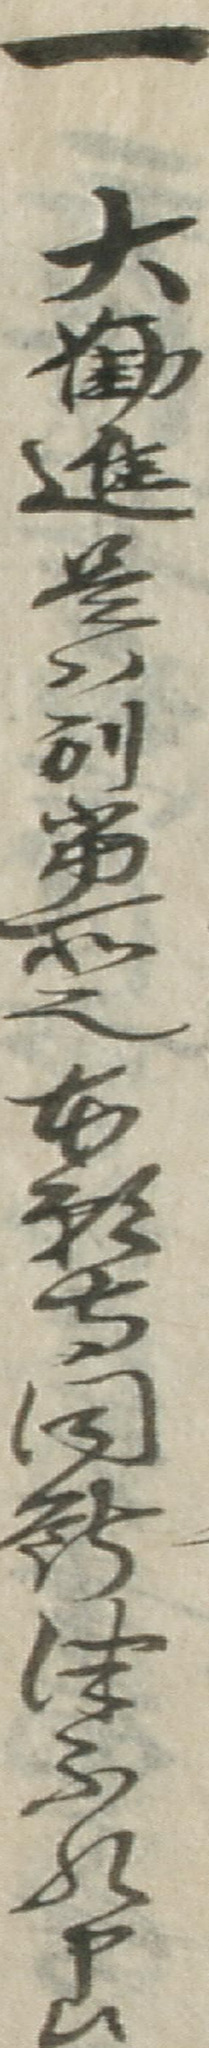一大勧進是ハ別当所也本願寺同断つふれ申候
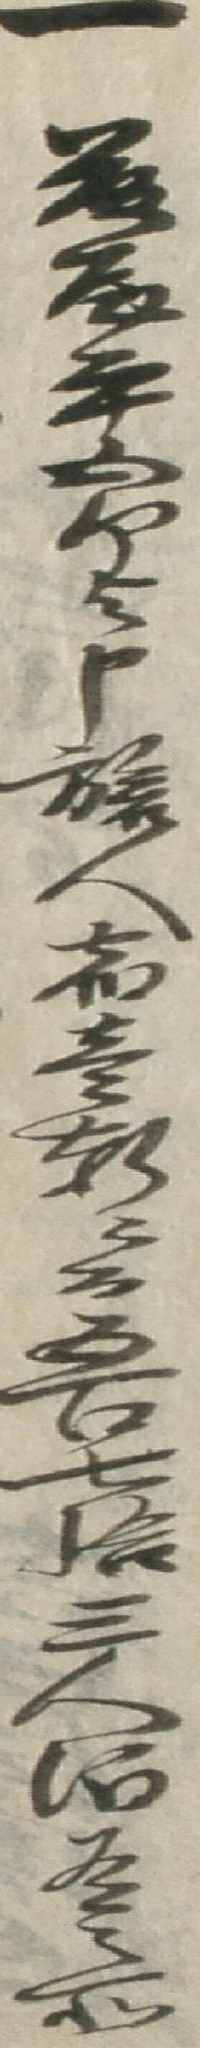一藤屋平五郎と申旅人宿壱軒二而五百七拾三人泊有之所
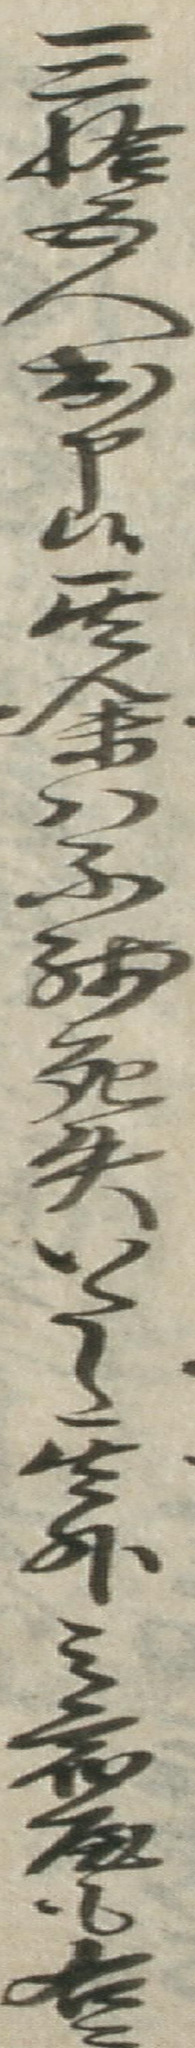三拾五人出申候其余ハ不残死失いたし其外之宿屋も右二
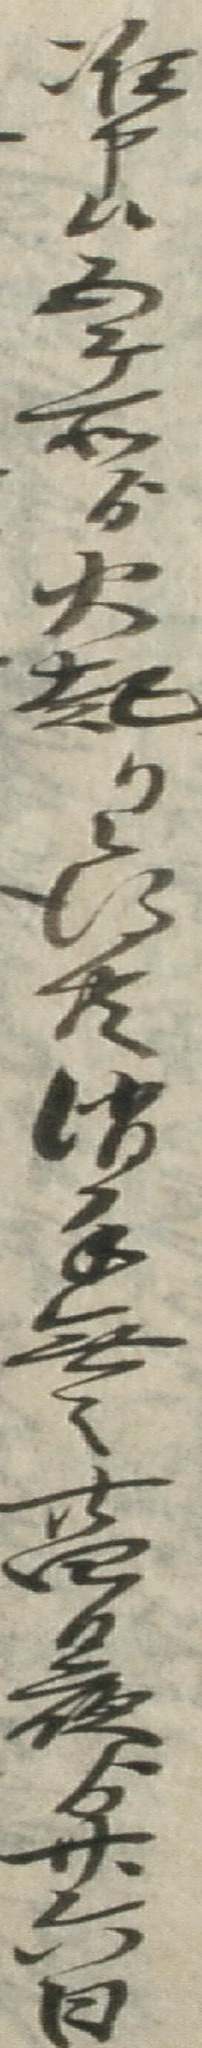準申候五ヶ所ゟ火起り候得共消手無之廿四日夜ゟ廿六日
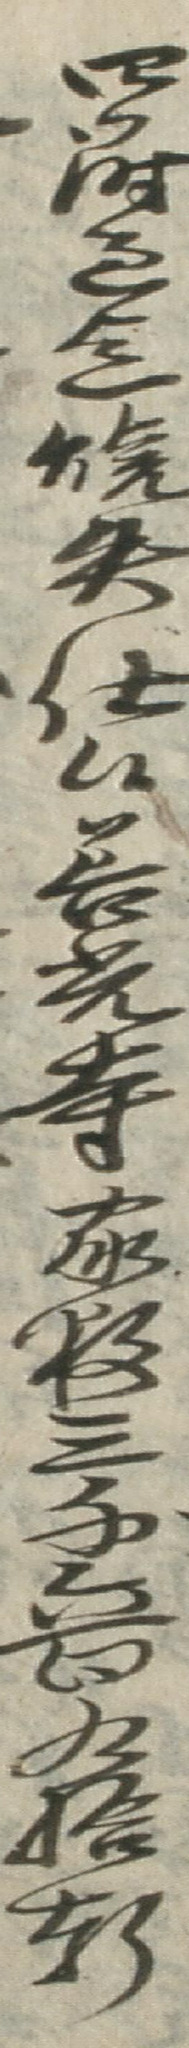四ッ時過迄焼失仕候善光寺家数三千六百九拾軒
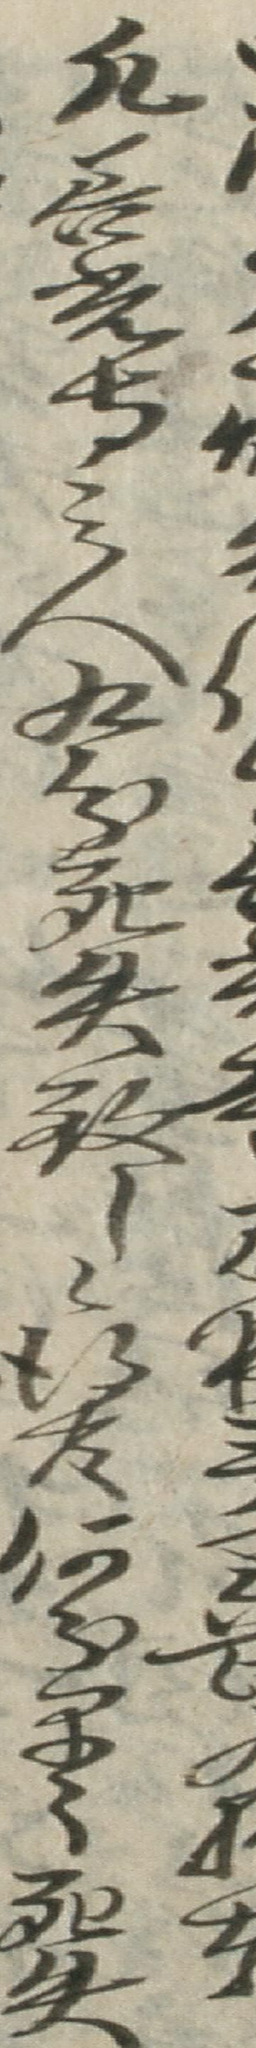凡善光寺之人九分死失致し候得共何分早々死失
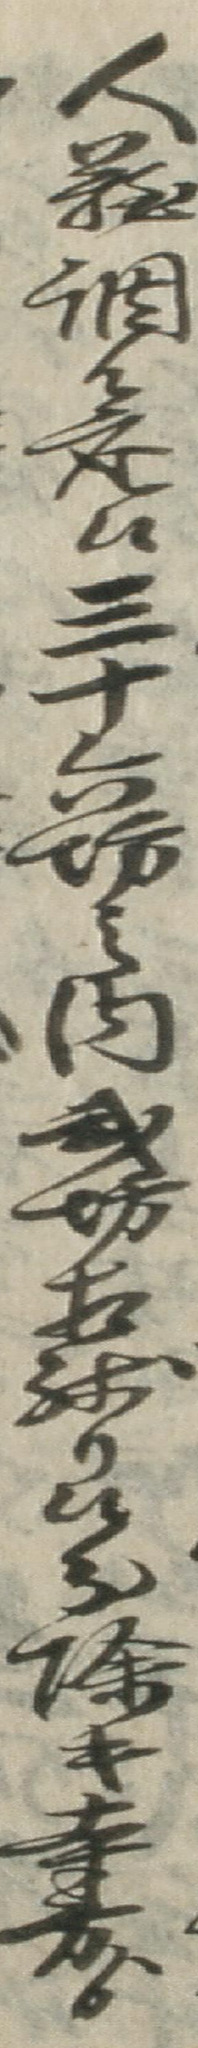人難調御座候三十六坊之内弐坊相残り候分除キ寺方ゟ
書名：信濃國地震實録記
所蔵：東京大学地震研究所図書室 Earthquake Research Institute Library, The University of Tokyo, JAPAN
